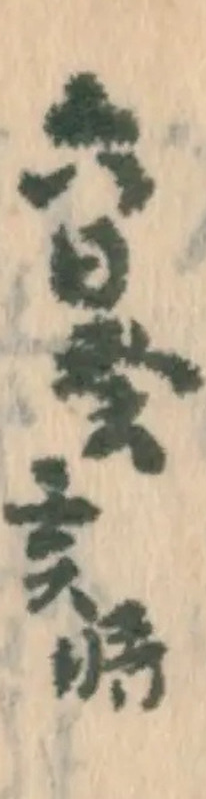六日癸亥晴
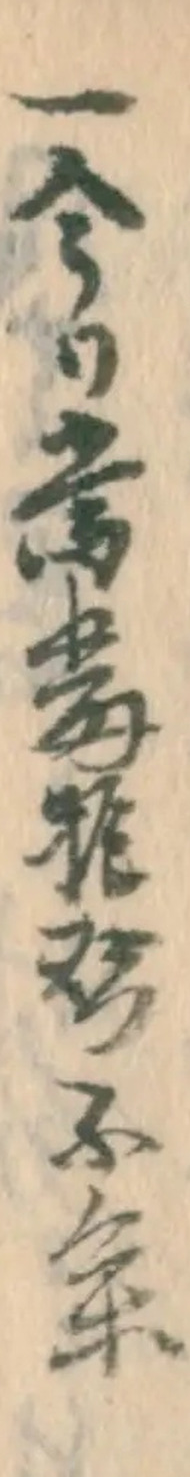一今日当番振替不参
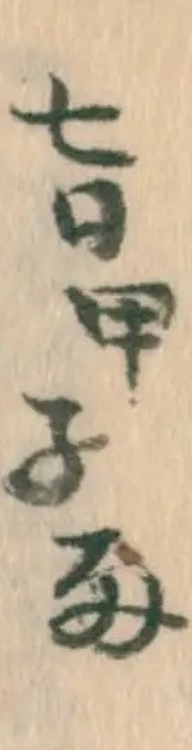七日甲子雨
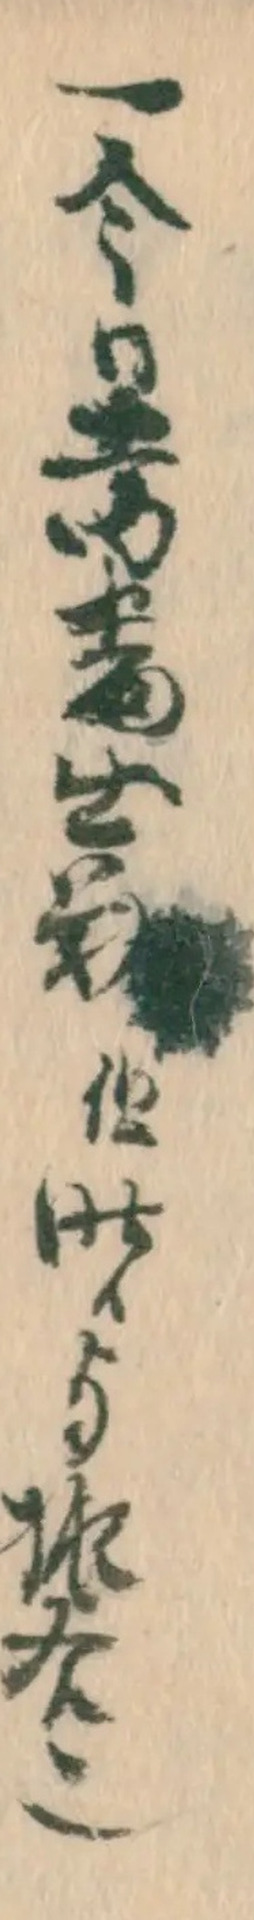一今日当番出勤但昨日より振替也
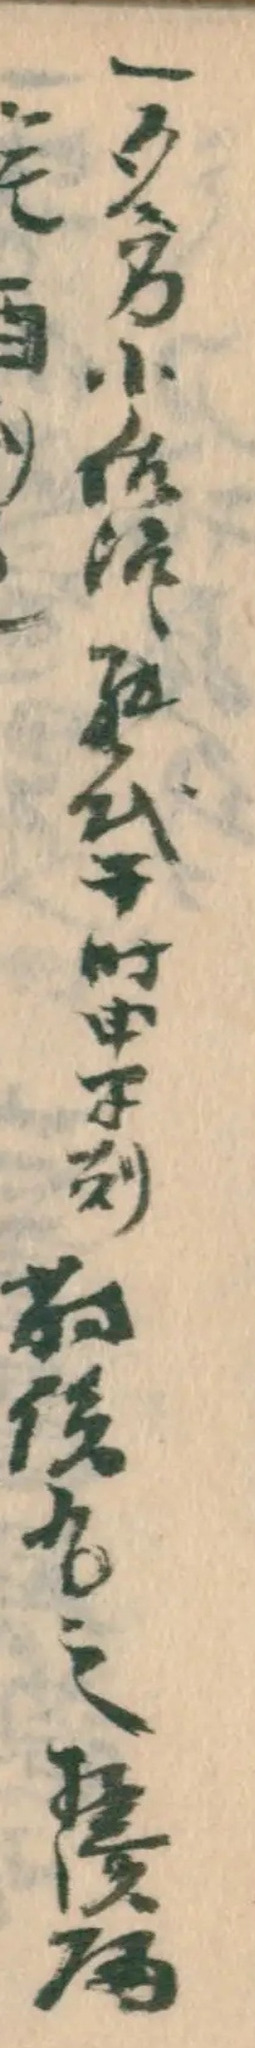一夕方小佐治へ罷越于時申半刻対談有之相済帰
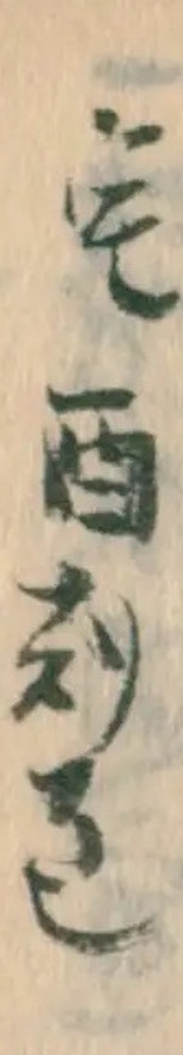宅酉刻過
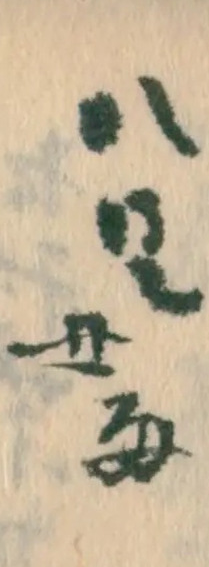八日乙丑雨
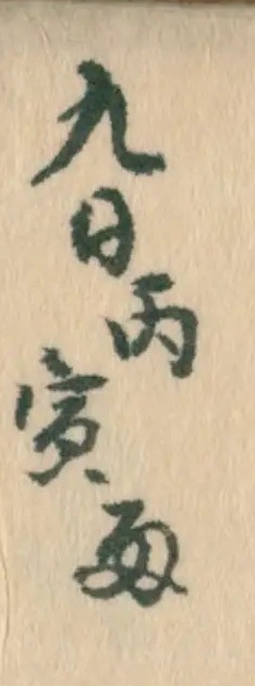九日丙寅雨
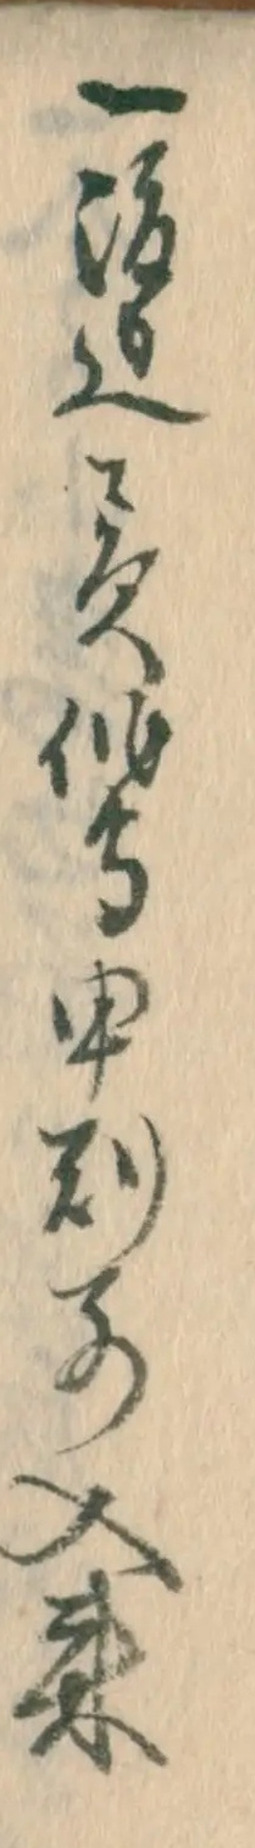一渡辺美作守申刻前入来

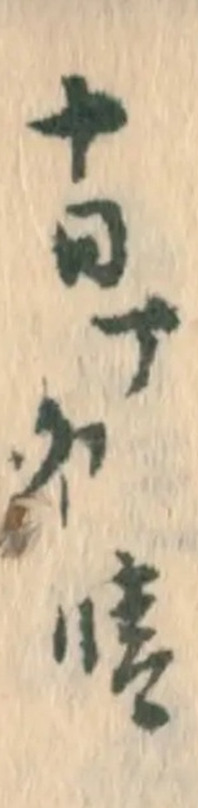十日丁卯晴
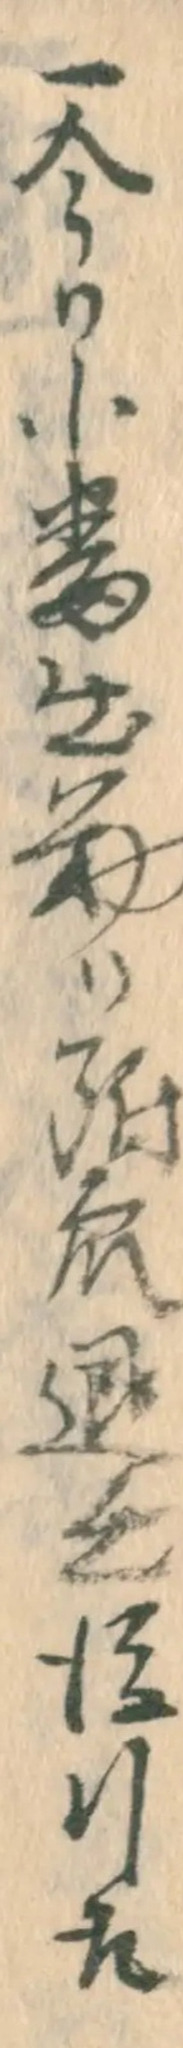一今日小番出勤御附衆退出後引取
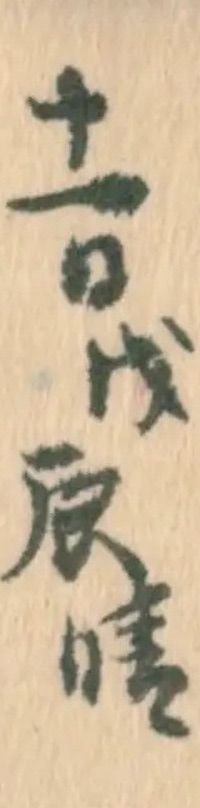十一日戊辰晴
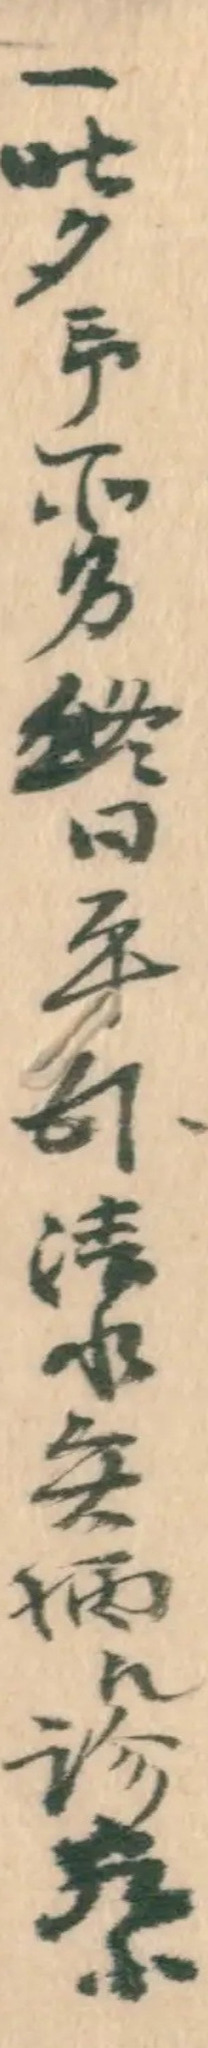一昨夕予所労終日平臥清水矢柄え診察
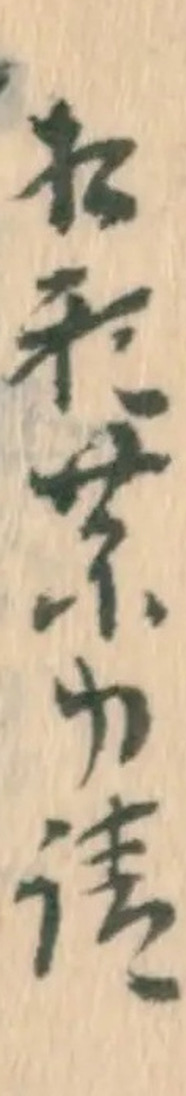相頼薬申請
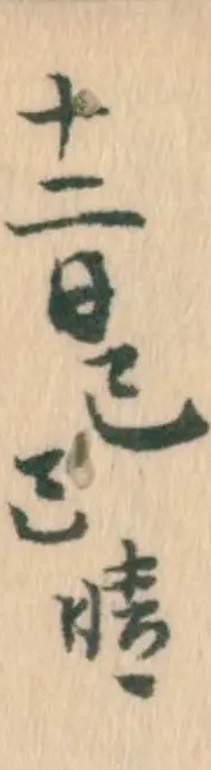十二日己巳晴
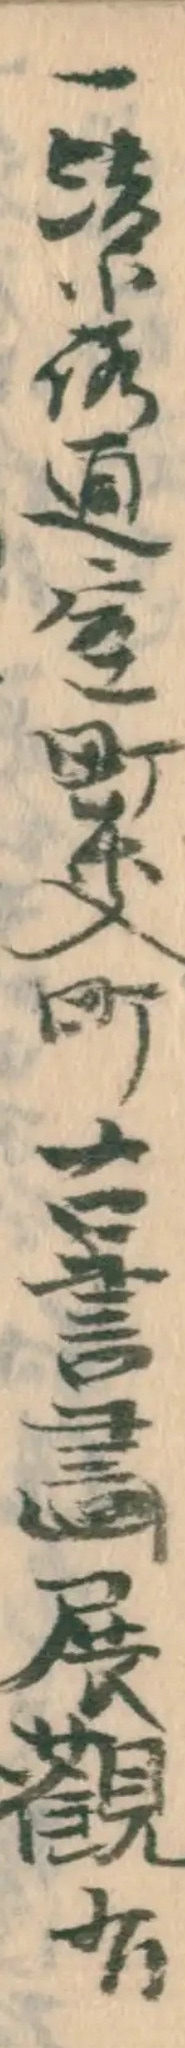一綾小路通室町東入町古書画展観有
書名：禁裏御所御用日記. [131]
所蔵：国立国会図書館 National Diet Library, JAPAN
